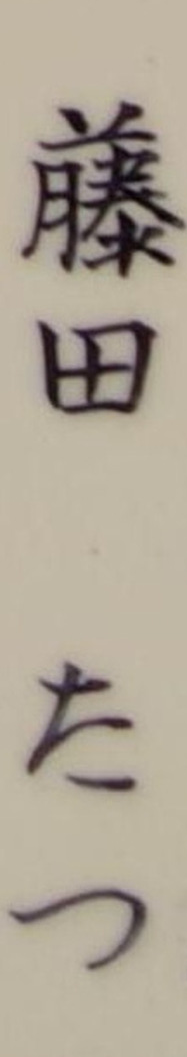藤田たつ
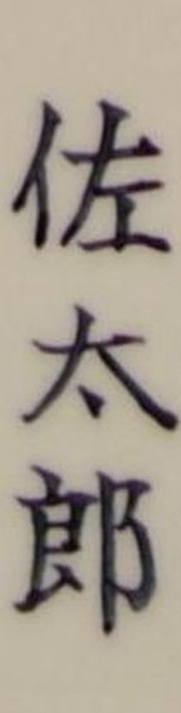佐太郎
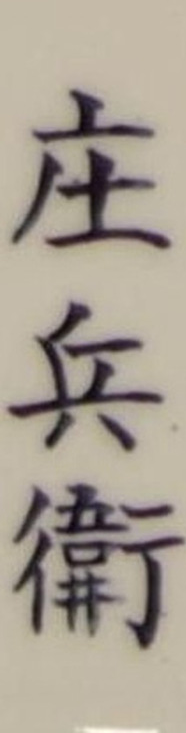庄兵衛
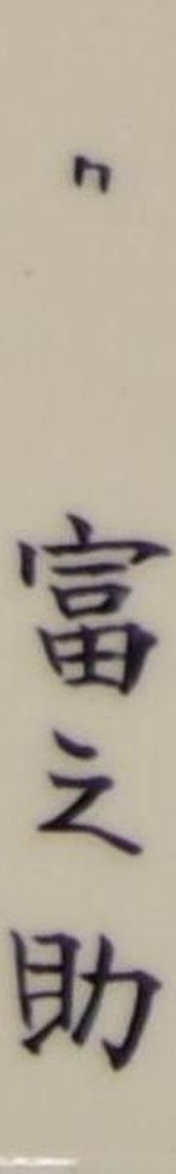富之助
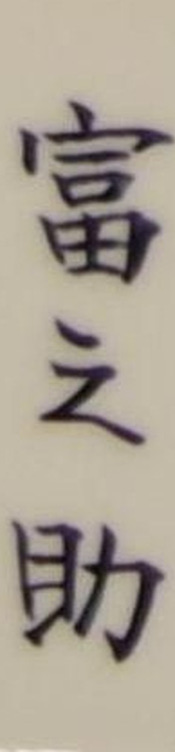富之助
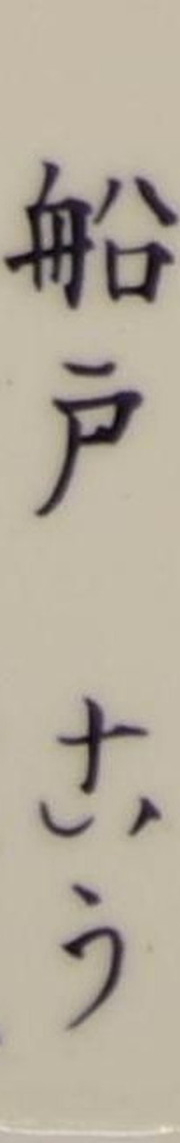船戸こう

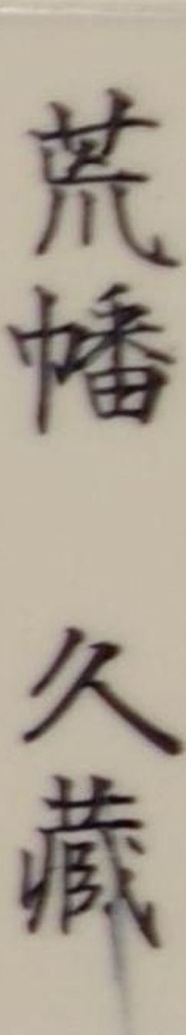荒幡久蔵
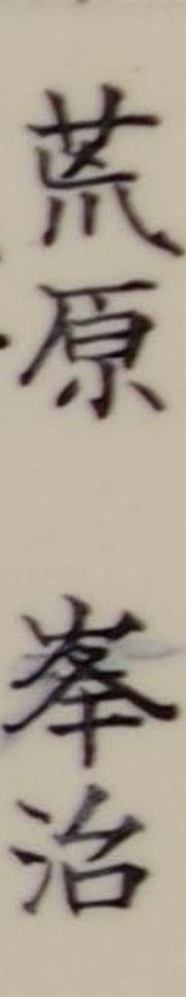荒原峯治
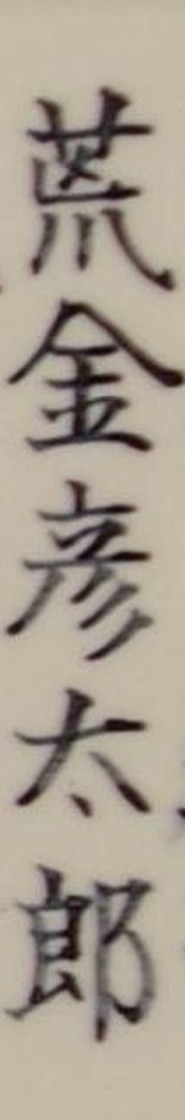荒金彦太郎
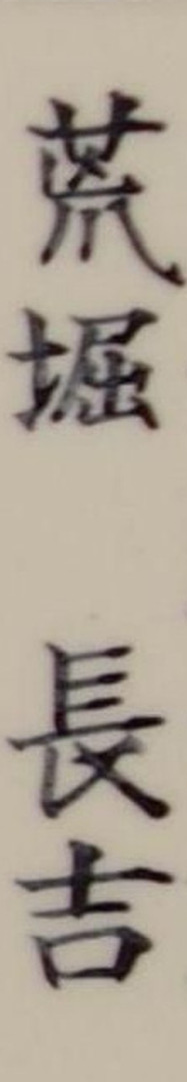荒堀長吉
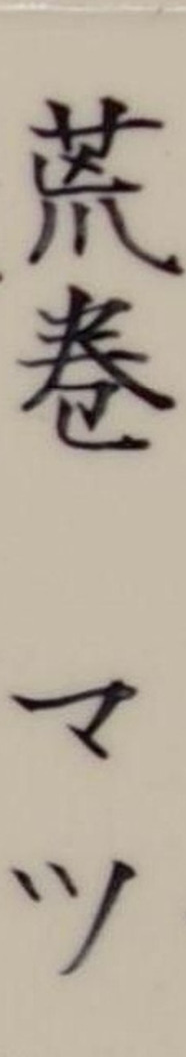荒巻マツ
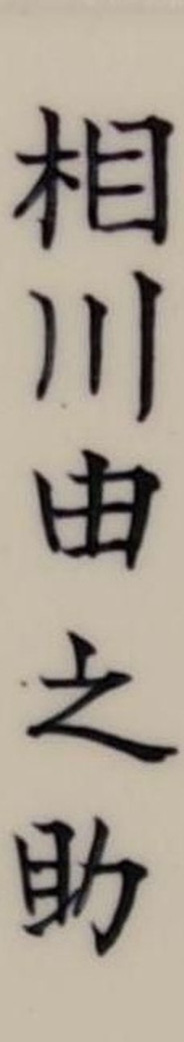相川由之助
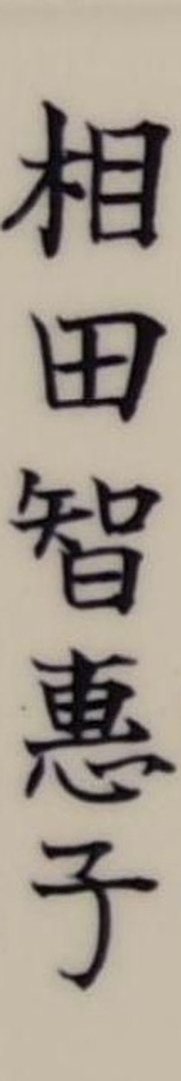相田智惠子
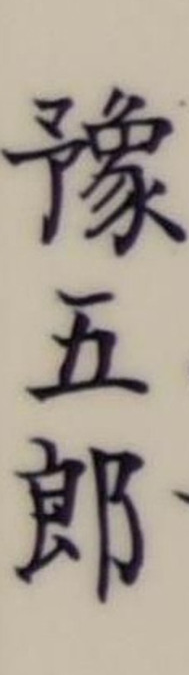豫五郎

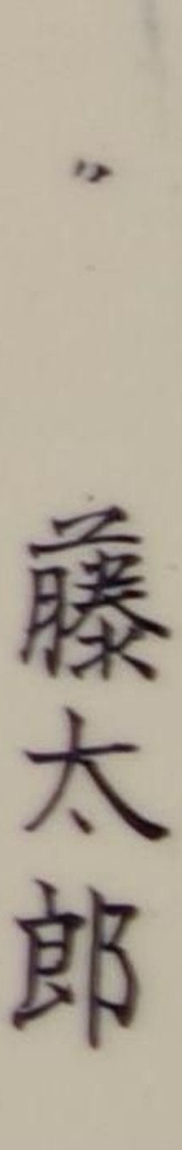藤太郎
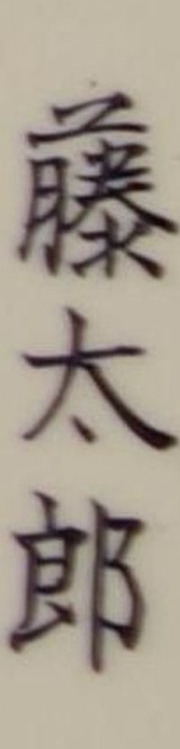藤太郎
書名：E~L
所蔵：高野山金剛峯寺
